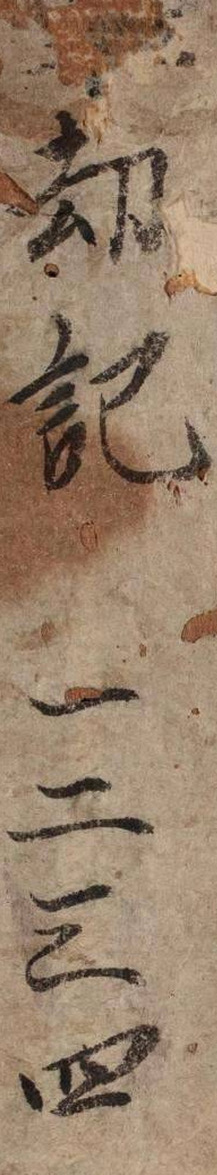塵劫記一二三四

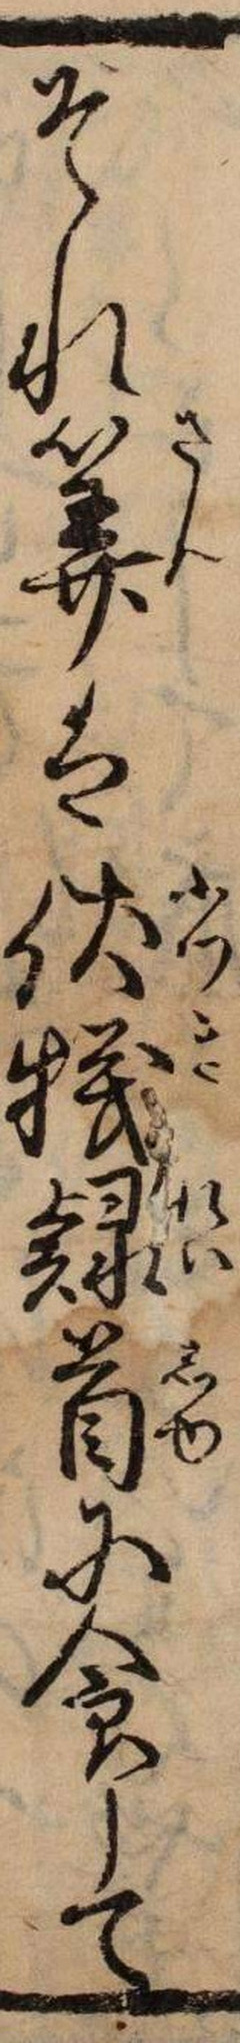それ筭は伏犠隷首に命して
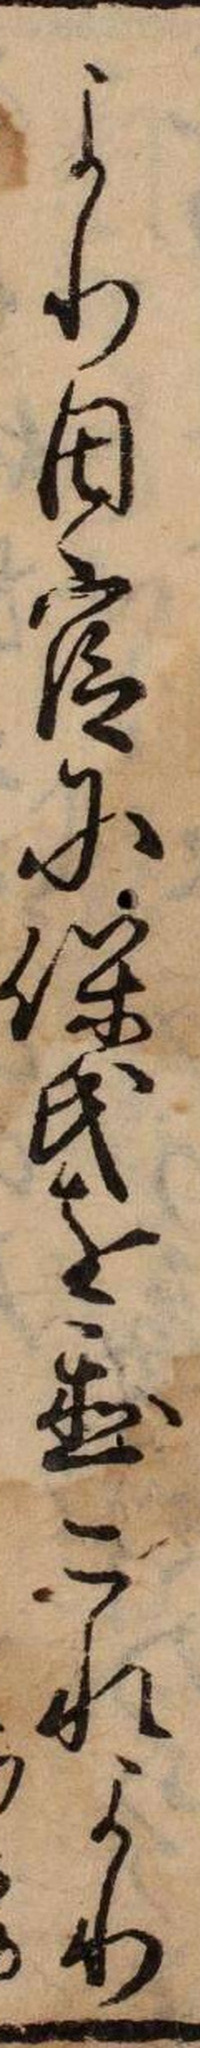より周官に保氏を置これより
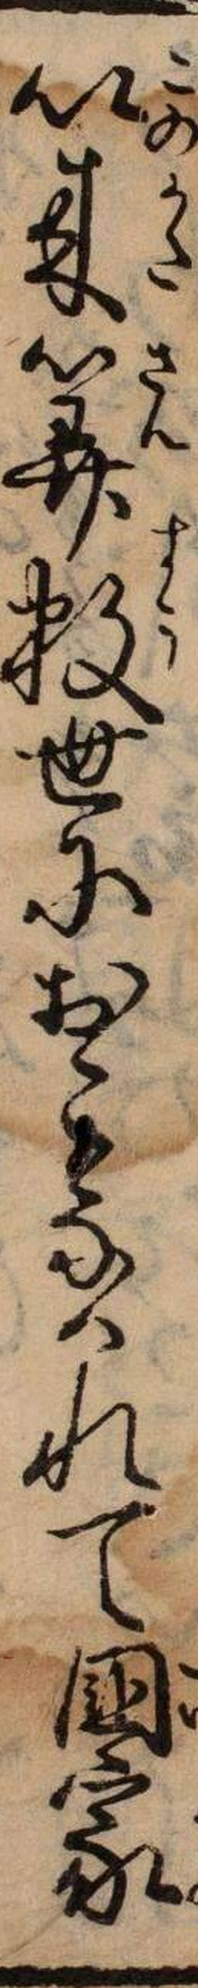以来筭数世におこなハれて国家
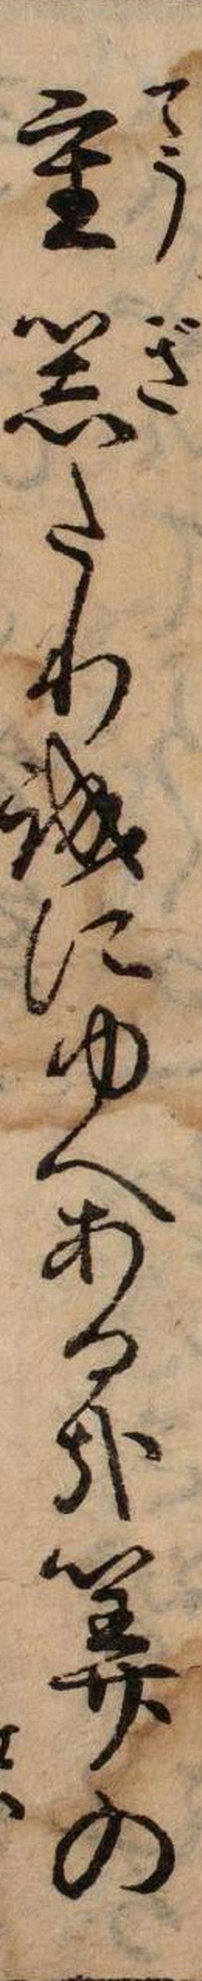重器たり誠にゆへある哉筭の
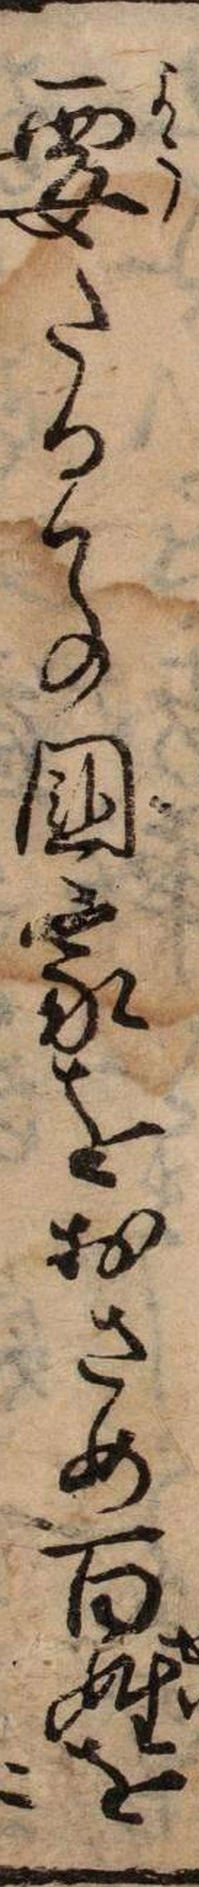要たる事国家をおさめ百姓を
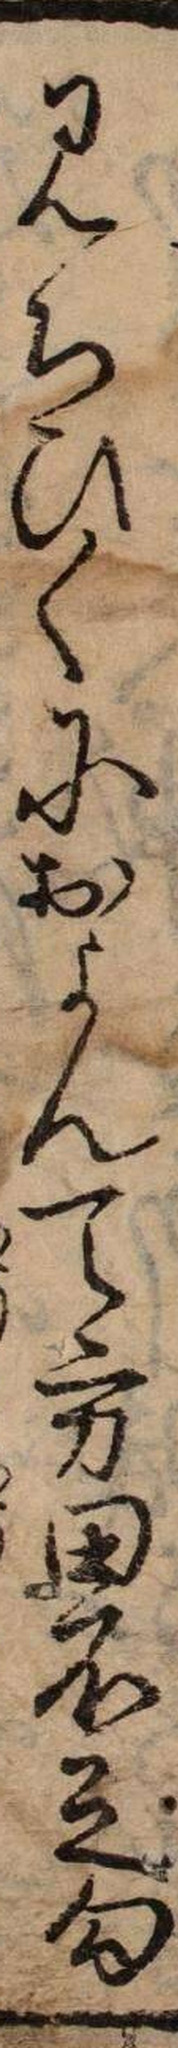みちひくにおよんて方田不足勾
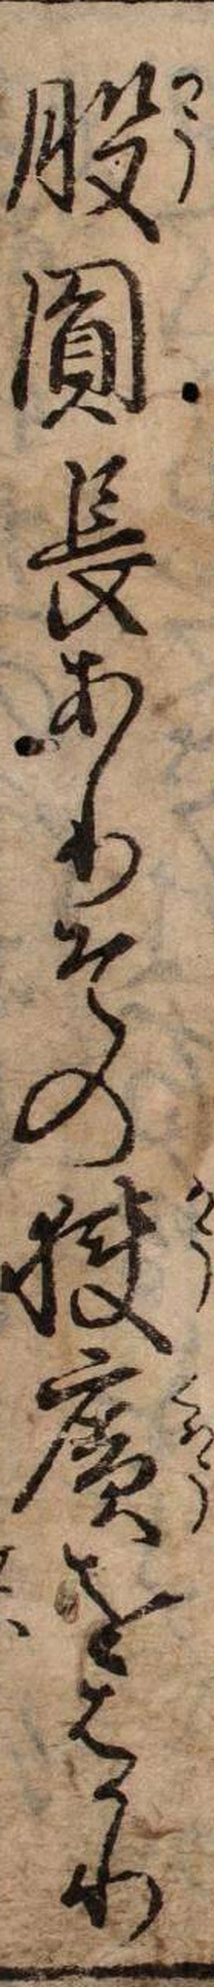股圓長ありその狭廣をはかり
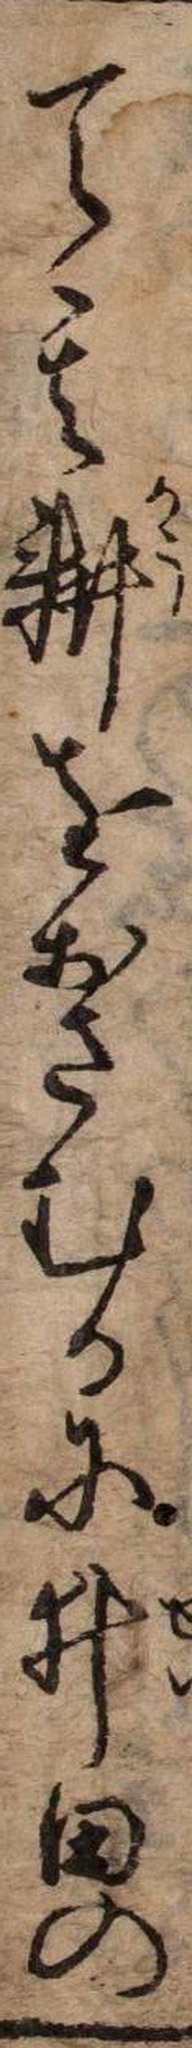て其耕をおさむるに井田の

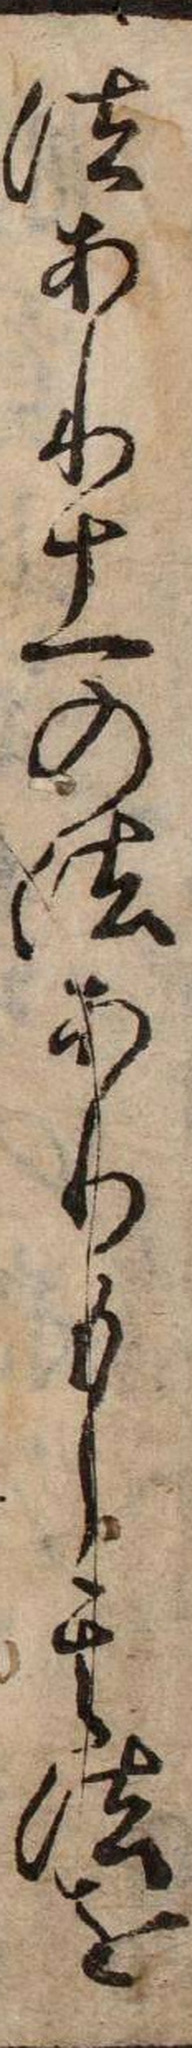法あり十一の法ありもし）其法を
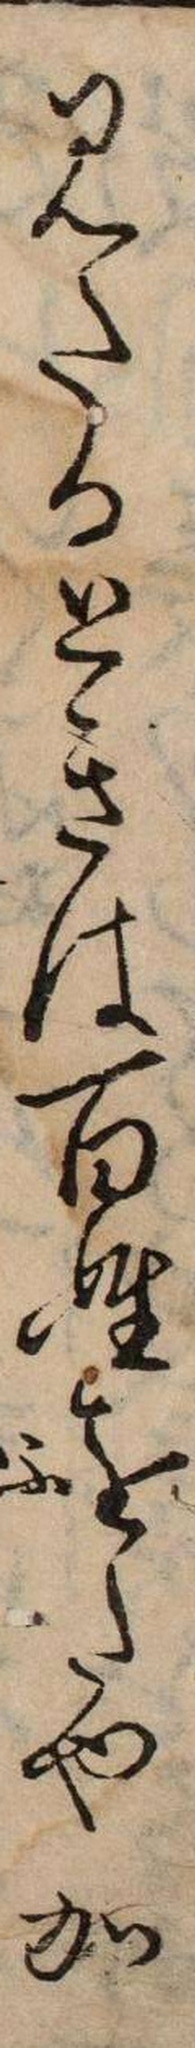みたるときは百姓をたやか
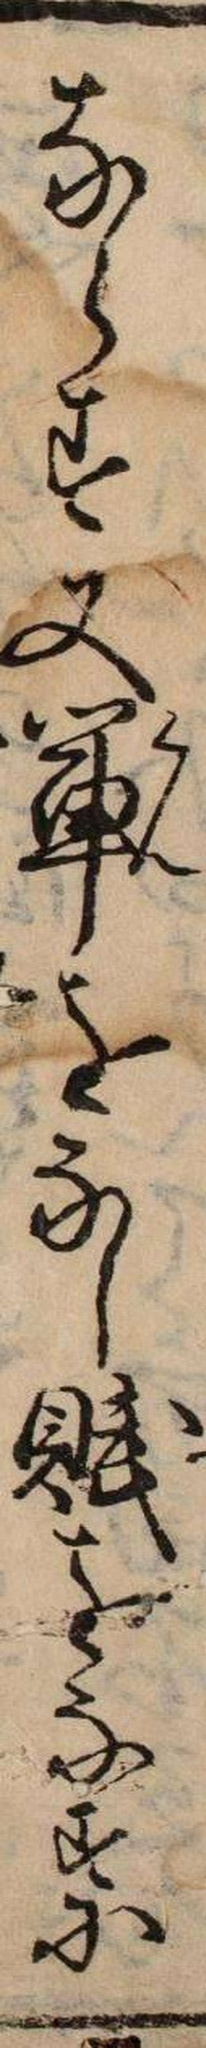ならす又軍をなし賦をなすに
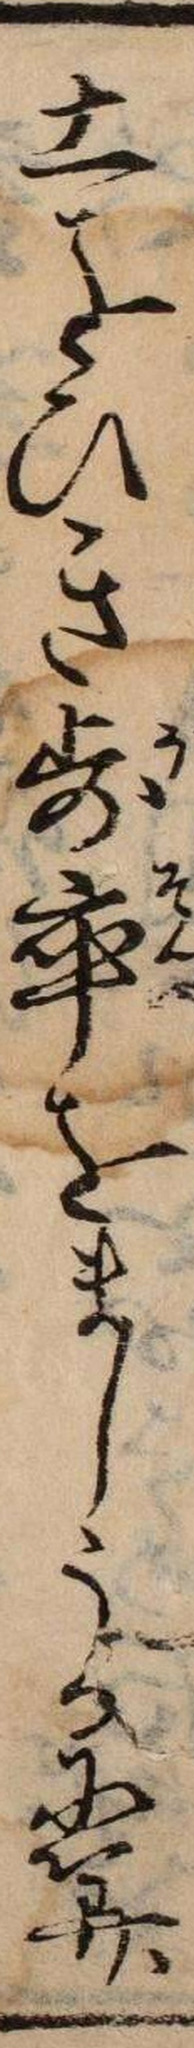土をひき歩卒をましうるに筭
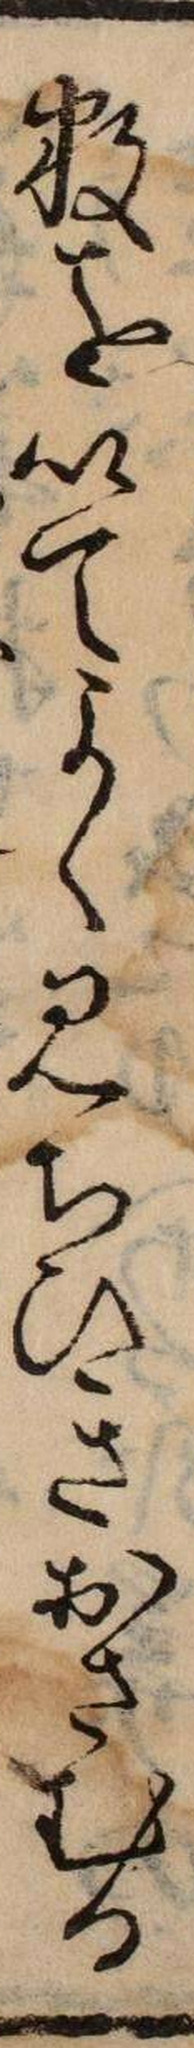数を以てよくみちひきおさむる
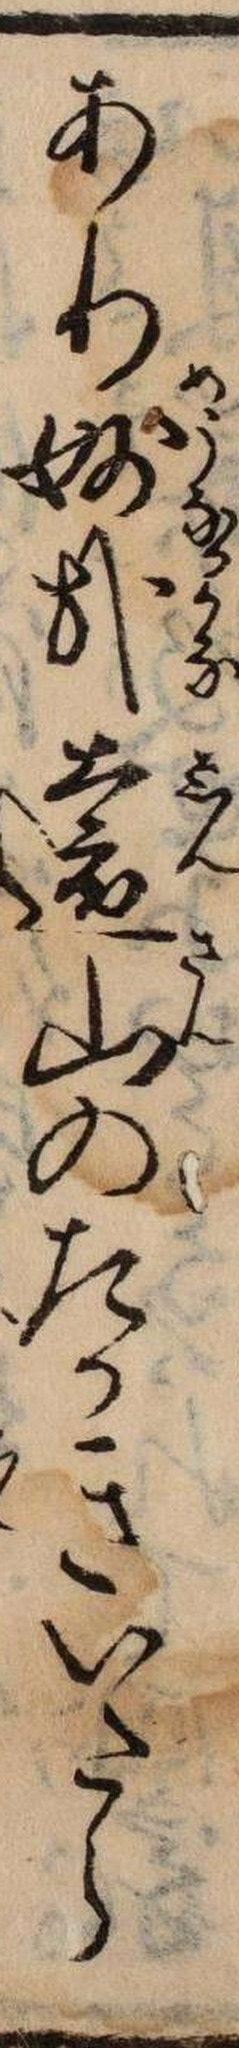あり妙哉遠山のたかきいたら
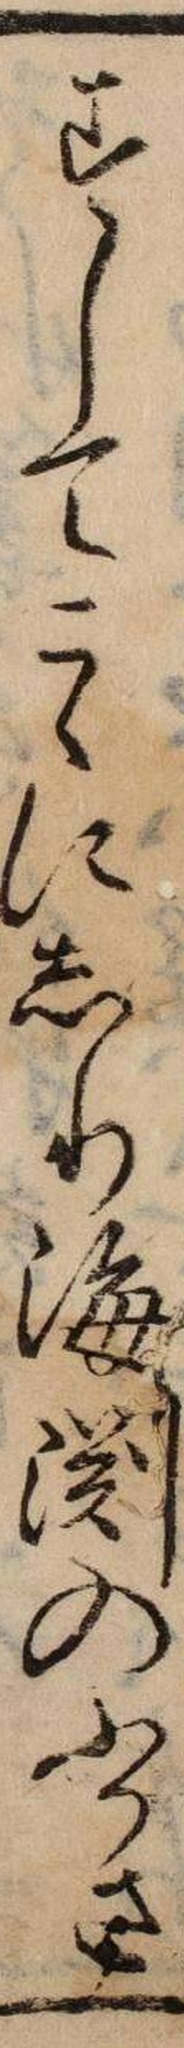すしてここにしり海淵のふかさ
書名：塵劫記（寛永11年自跋、京都府立京都学・歴彩館追貴8）
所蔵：京都府立京都学・歴彩館 国文学研究資料館
